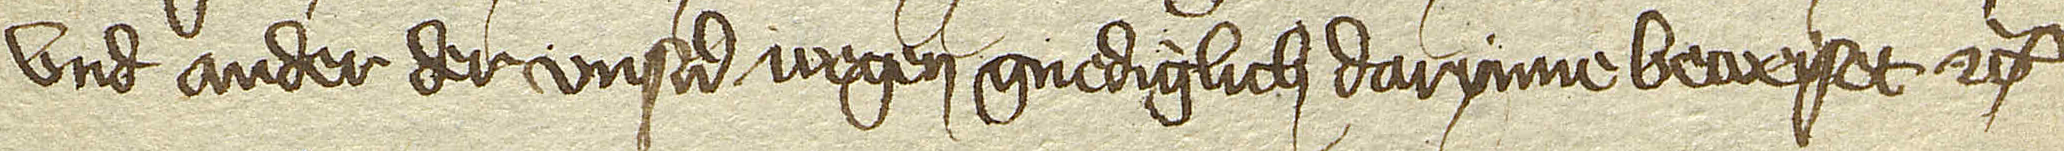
vnd ander der vnſn* wegen gnediglich darynne beweiſet ec*
